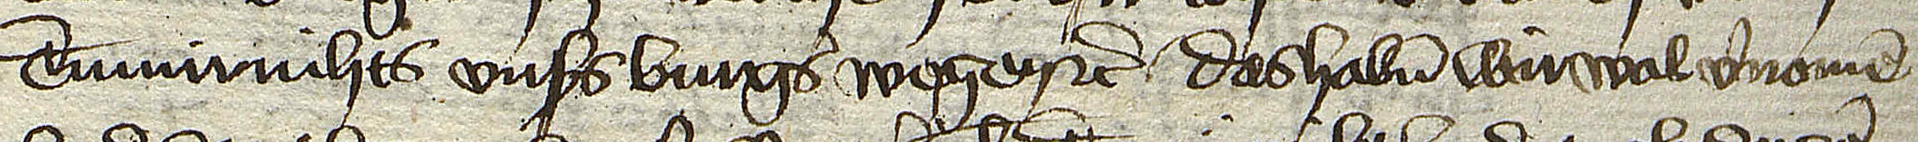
Tumirnihts vnſ*s burg*s wegen ec* / Das hab*n wir wol v*nome*
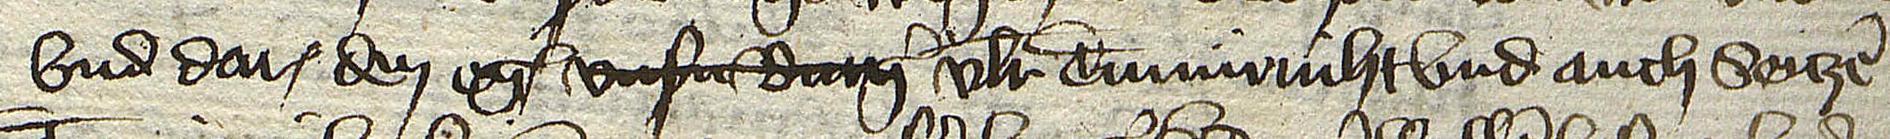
Vnd dar* den eg* vnſn* Burg* vlr* Tumirniht Vnd auch Seicʒe*
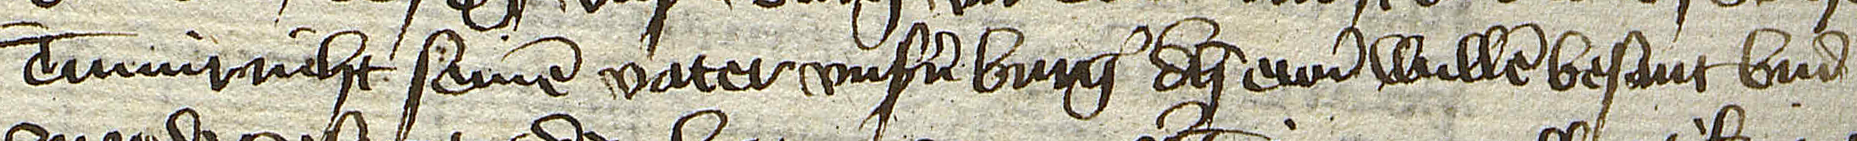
Tumirniht ſeine* vater vnſ*n burg* dh* ew*n wille* beſant vnd
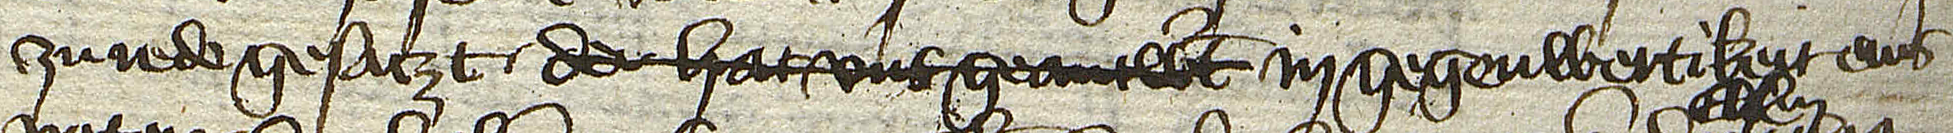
cʒu rede geſacʒt / der hat vns geantw*t in gegenwertikeit ews*
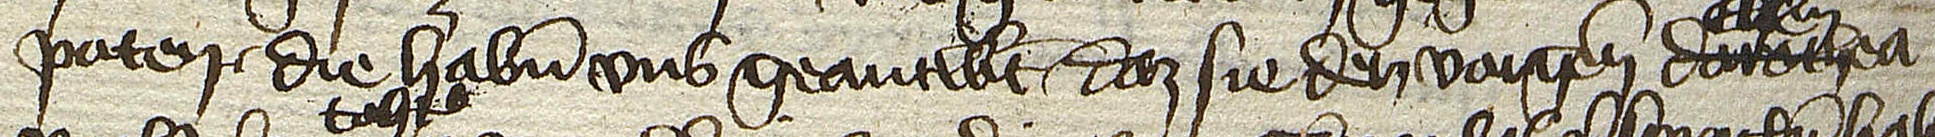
poten / die hab*n vns geantw*t / daʒ ſie der vorge*n dorothea
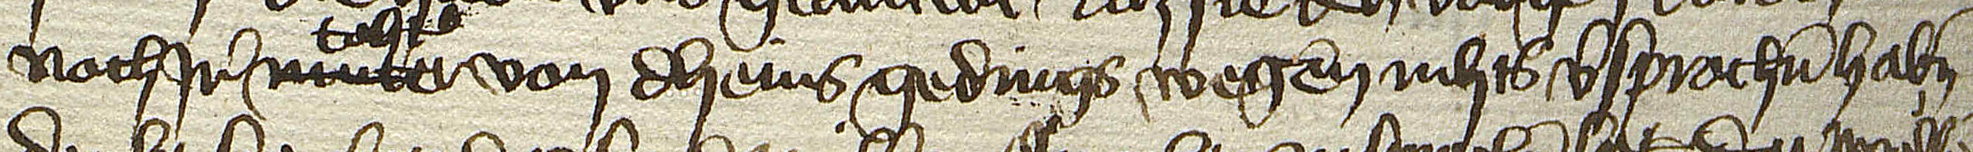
noch Ir* muter von dheins gedings wegen nihts v*ſproch*n hab*n
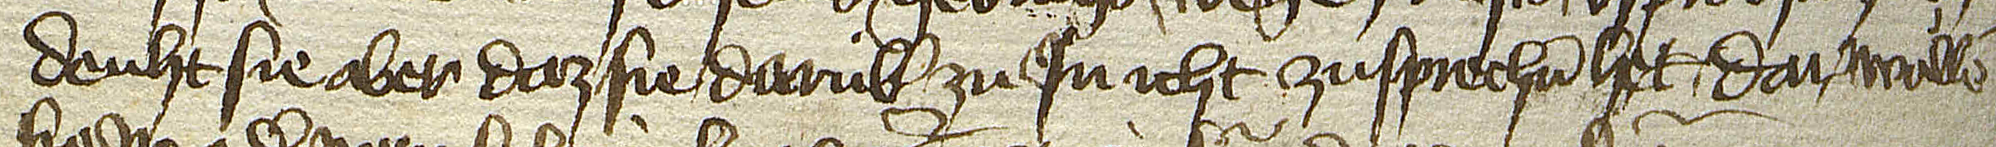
deuht ſie aber daʒ ſie darüb* cʒu In icht ʒuſprech*n het . Dar* wölle*
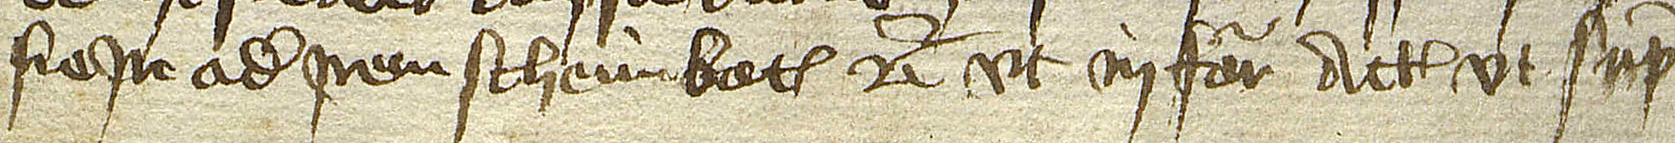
ſie Ir od* Irem ſcheinbot* ec* vt in for* Act* vt ſup*
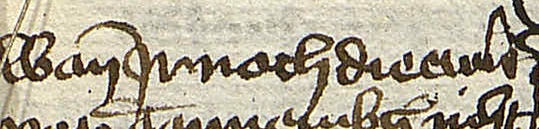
wan* Ir noch die ewn*
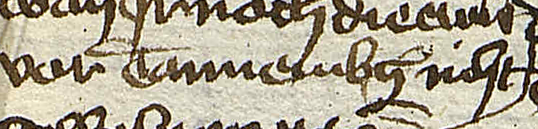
vor Tannembg* niht
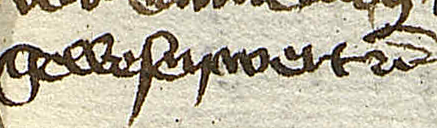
geweſen wert ec*
